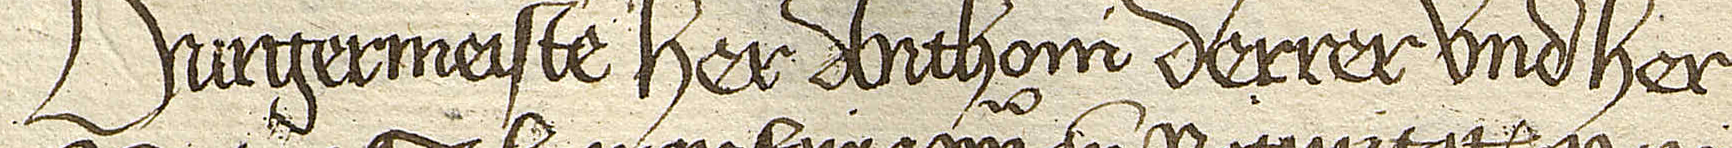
Burgermeiſte* Her Anthoni Derrer Vnd Her
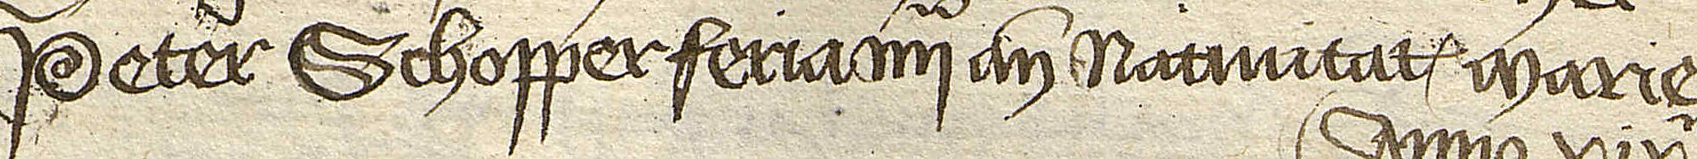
Peter Schopper feria an* Natiuitat* Marie
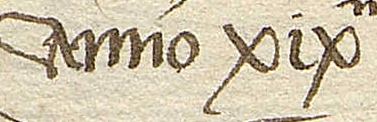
Anno xix*
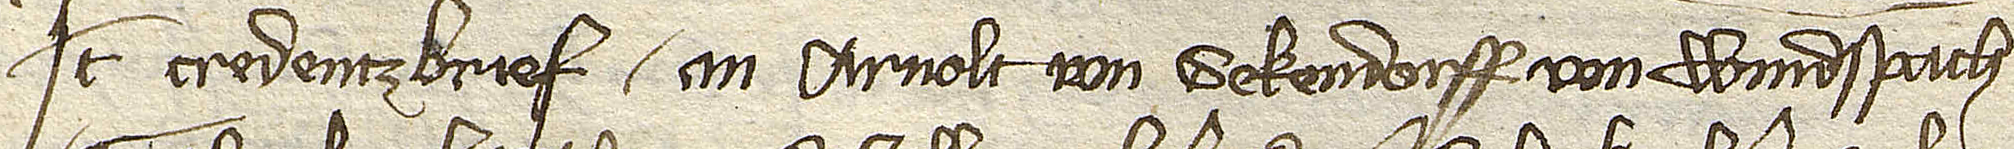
It* credecʒbrief / an Arnolt von Sekendorff von Windſpach
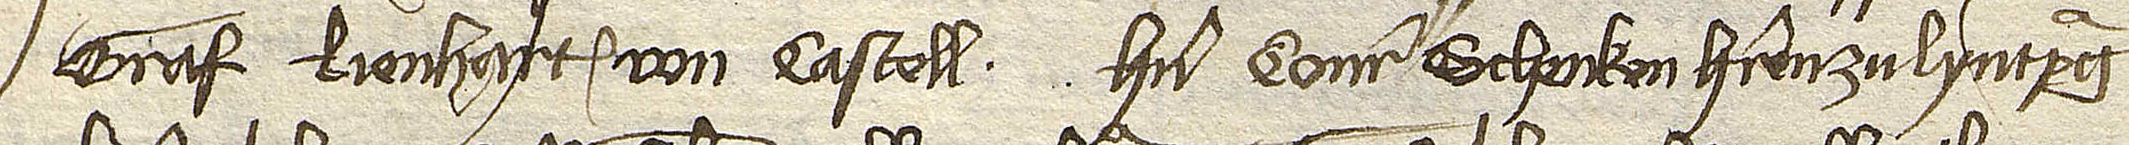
Graf lienhart* von Caſtell . hn* Conr* Schenken h*ren ʒu lyntp*g
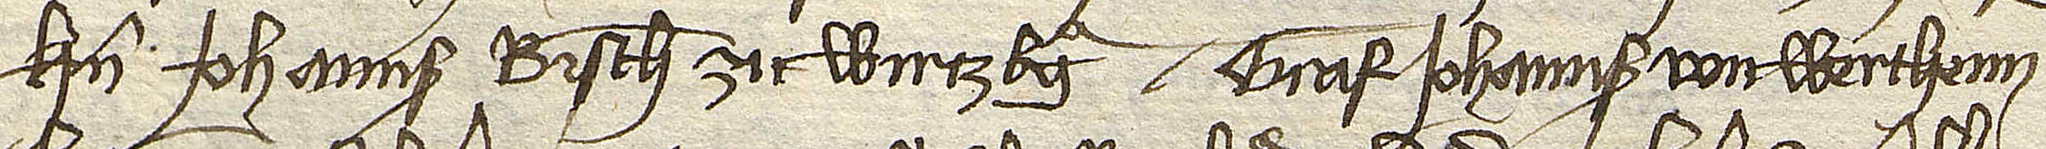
Hn* Iohannſ* Biſch* ʒu Wircʒb*g / Graf Iohannſ* von Wertheim
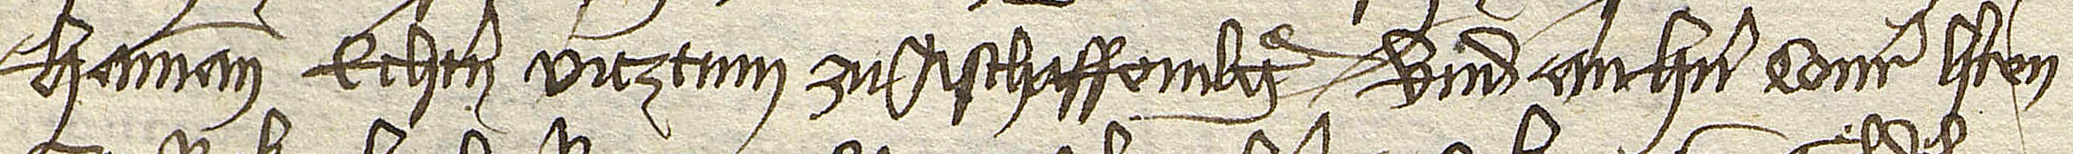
Ham*an Echt*n vicʒtum ʒu Aſchaffemb*g / Vnd an hn* Conr* h*ren
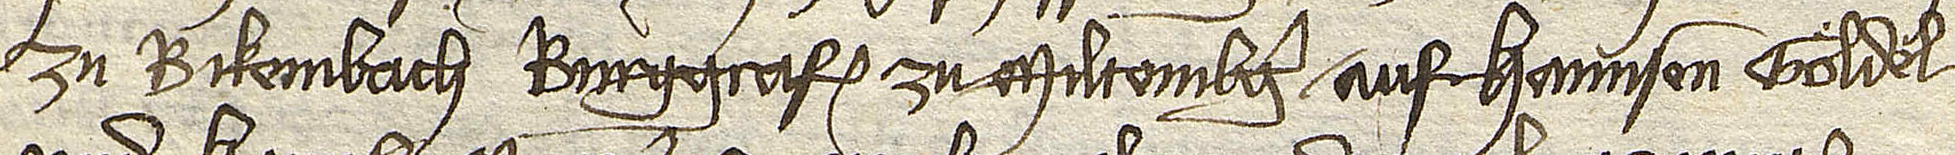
ʒu Bikembach Burggraf* ʒu Miltemb*g / auf hannſen Göldel
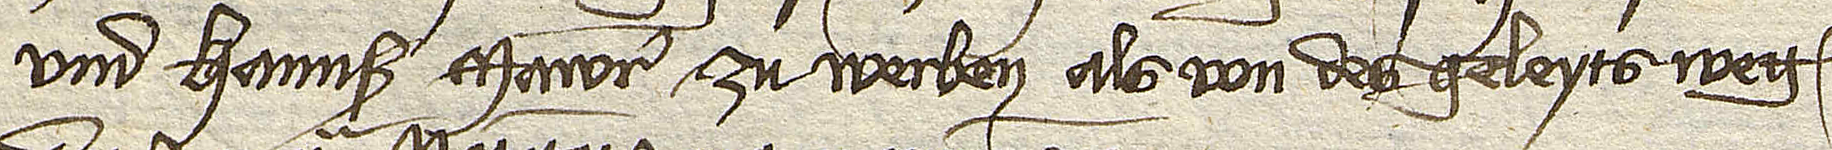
vnd hannſ* Mawr* / ʒu werben als von des geleyts weg*
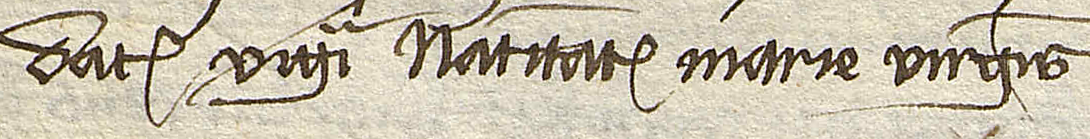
Dat* vigi* Nati*tat* marie virg*is
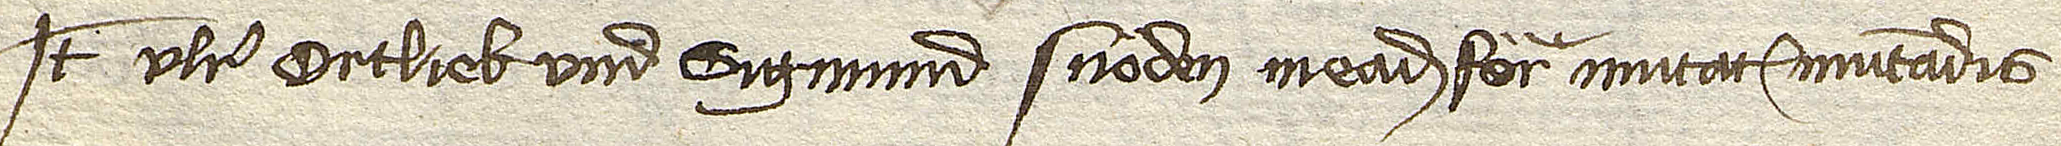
It* vlr* Ortlieb vnd Sigmund ſnöden in ead* for* mutat* muta*dis
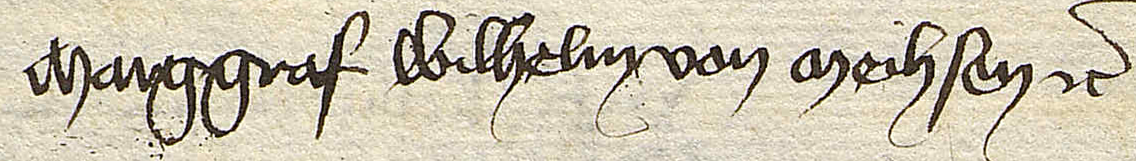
Marggraf Wilhelm von Meihſen ec*
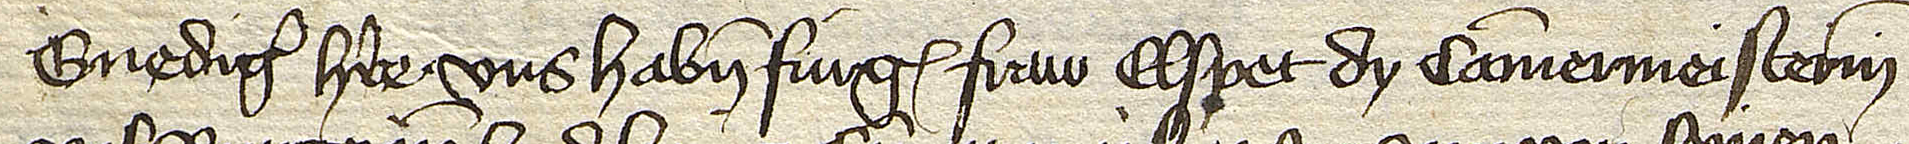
Gnedig* h*re . vns habn* fürg* fraw Elſpet dy Cam*ermeiſterin*
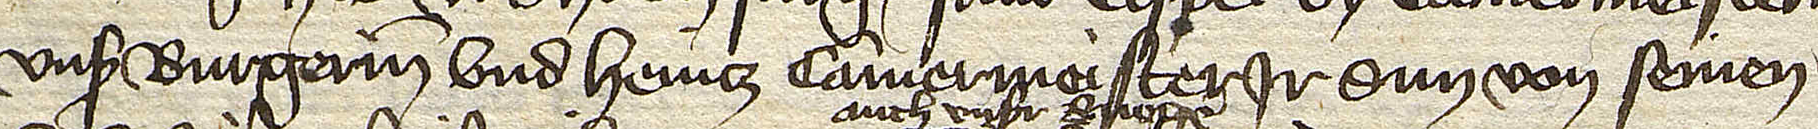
vnſ* Burgerin* vnd heincʒ Cam*ermeiſter Ir Sun von ſeinen
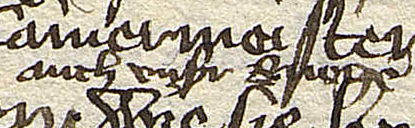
auch vnſ*r Burge*
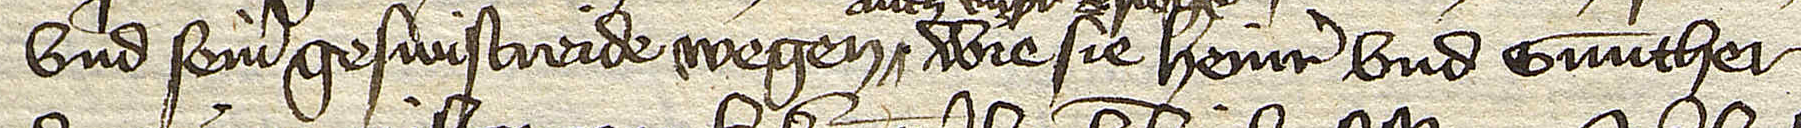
vnd ſein* geſwiſtreide wegen wie ſie heinr* vnd Gunther
